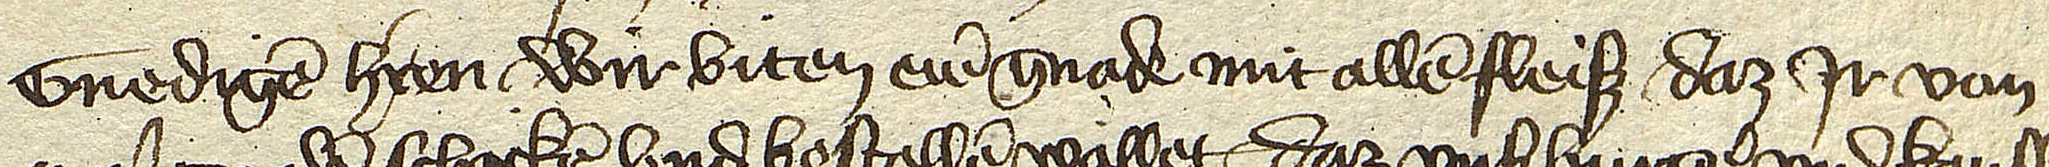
Gnedige* h*ren / wir biten ew* gnade mit alle* fleiſʒ / daʒ Ir von
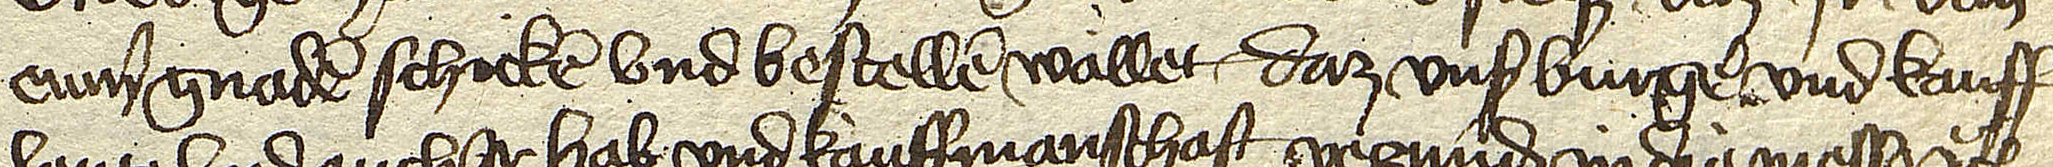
ewn* gnade* ſchicke* vnd beſtelle* wöllet / daʒ vnſ* burge* vnd kauff
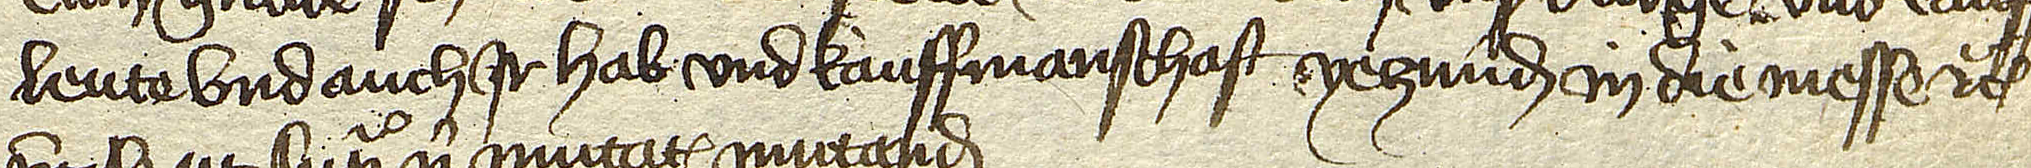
leute vnd auch Ir hab vnd kauffmanſchaft yecʒund* in die meſſe ec*
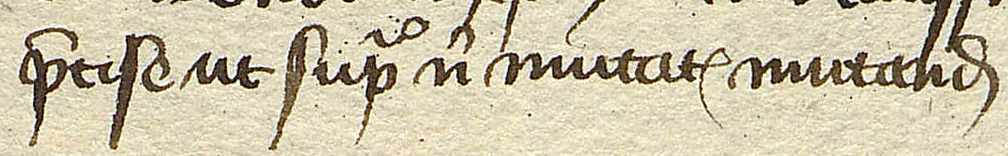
p*ciſe ut ſup* ii* mutat* mutand*
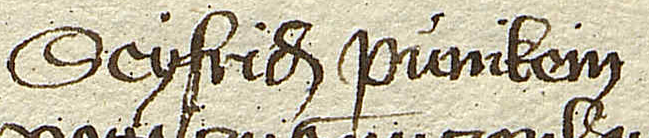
Seyfrid* Pünikein
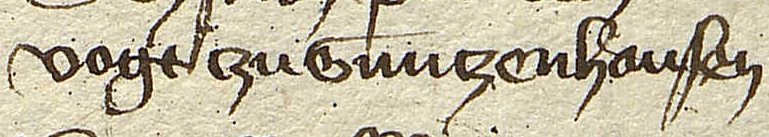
vogt cʒu Guncʒenhauſen
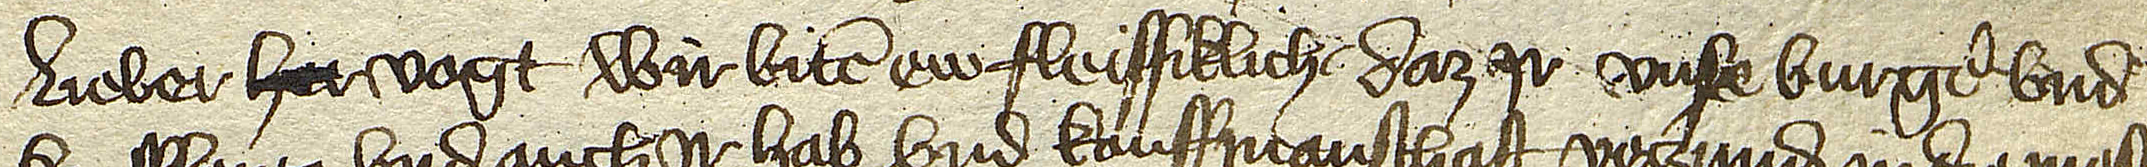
Lieber her vogt / Wir bite* ew fleiſſiklich* / daʒ Ir vnſ*e burge* vnd
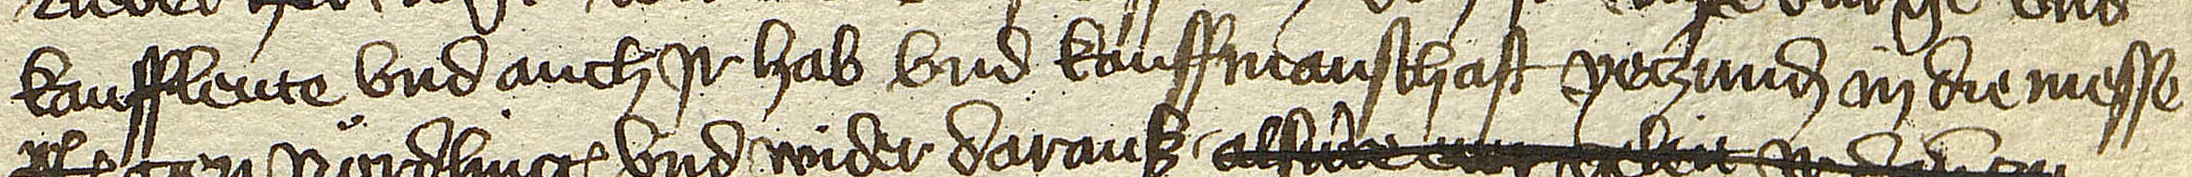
kauffleute vnd auch Ir hab vnd kauffmanſchaft yecʒund* in die meſſe
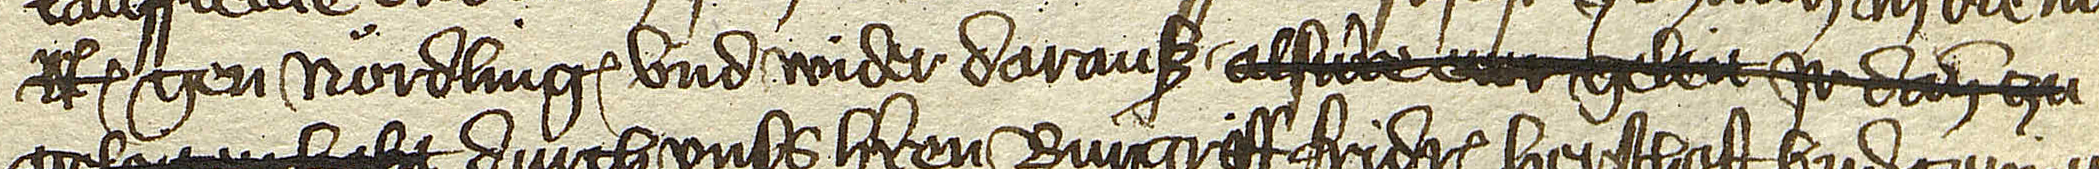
ec* gen Nördling* vnd wider darauſʒ / alſu*re ewr geleit Ir dan* cʒu
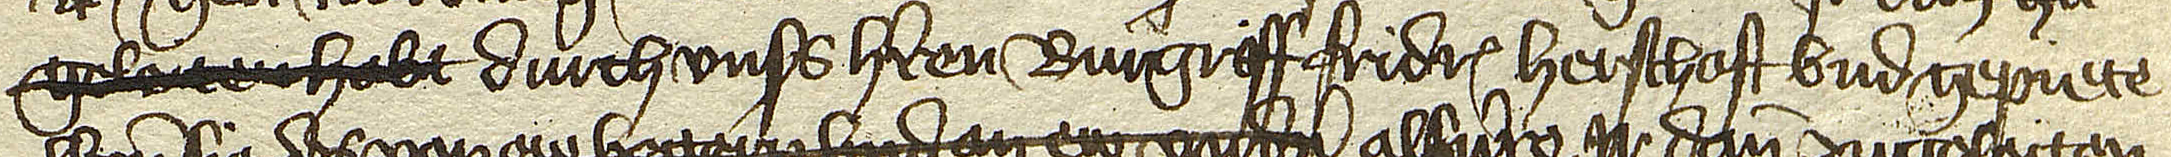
geleiten habt durch vnſ*s h*ren Burgraff fridr* herſchaft vnd gepiete
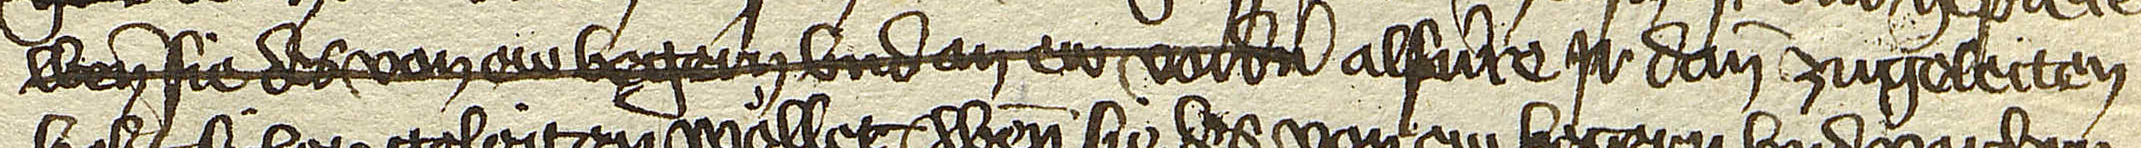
wen* ſie des von ew begern vnd an ew vordn* alſu*re Ir dan* ʒugeleiten
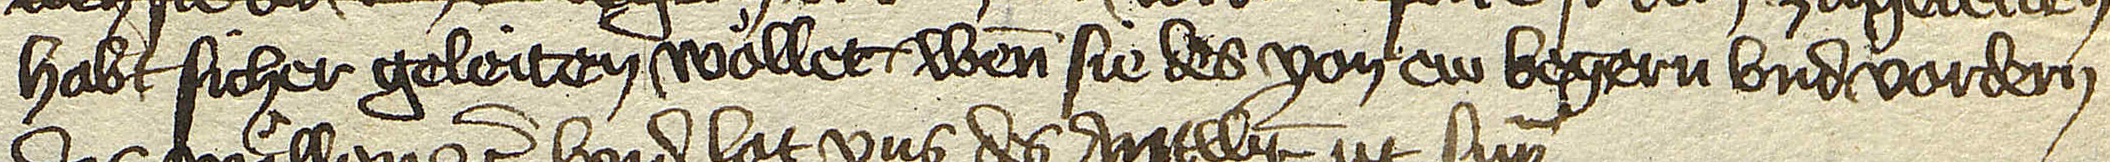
habt ſicher geleiten wöllet / wen* ſie des von ew begern vnd vordern
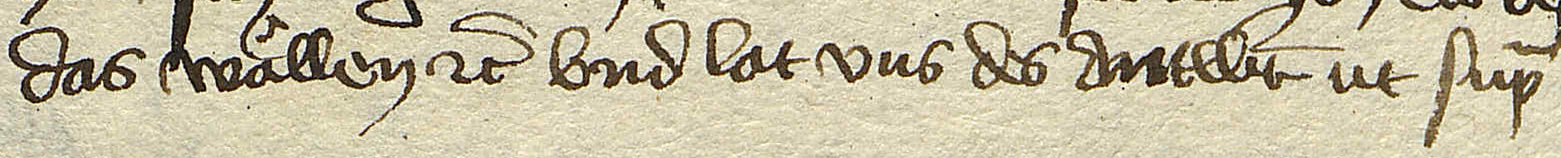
das wöllen ec* vnd hat vns des antw*t ut ſup*
